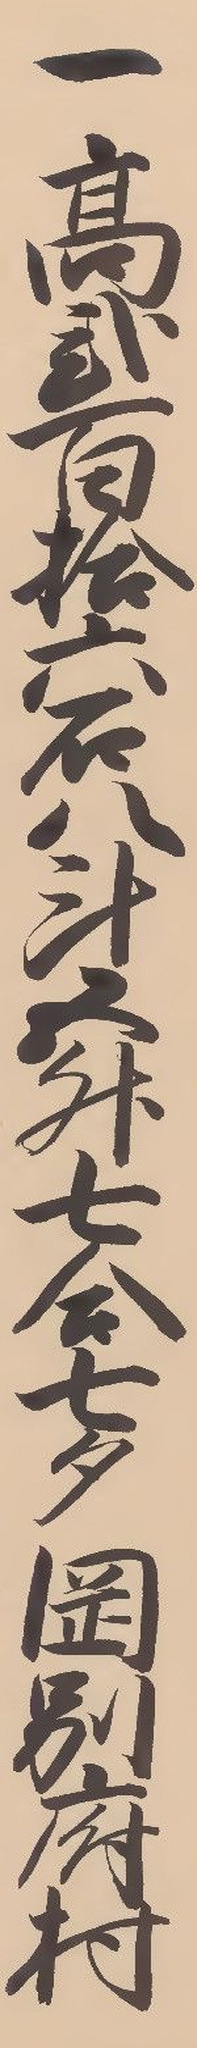一高弐百拾六石八斗五升七合七勺岡別府村
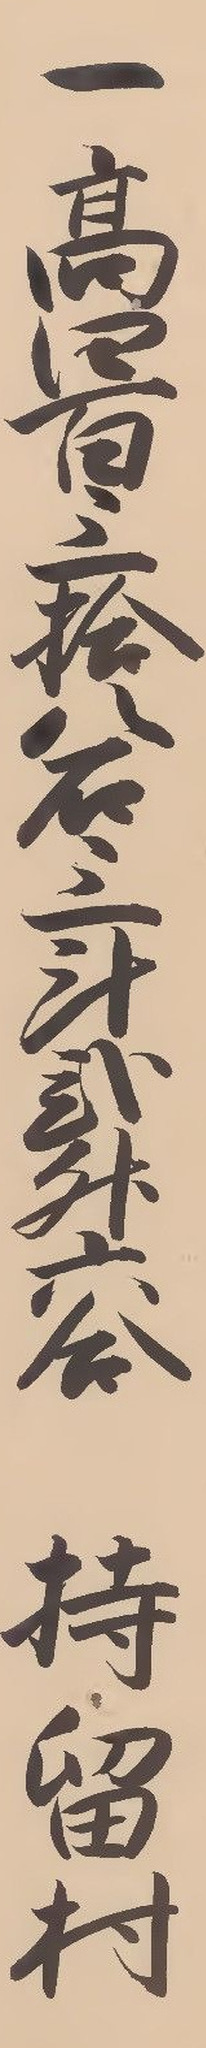一高四百三拾八石三斗弐升六合持留村
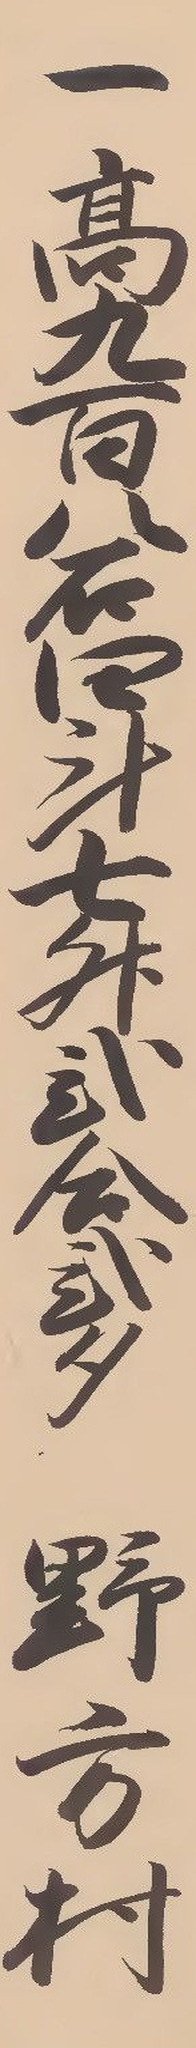一高九百八石四斗七升弐合弐勺野方村
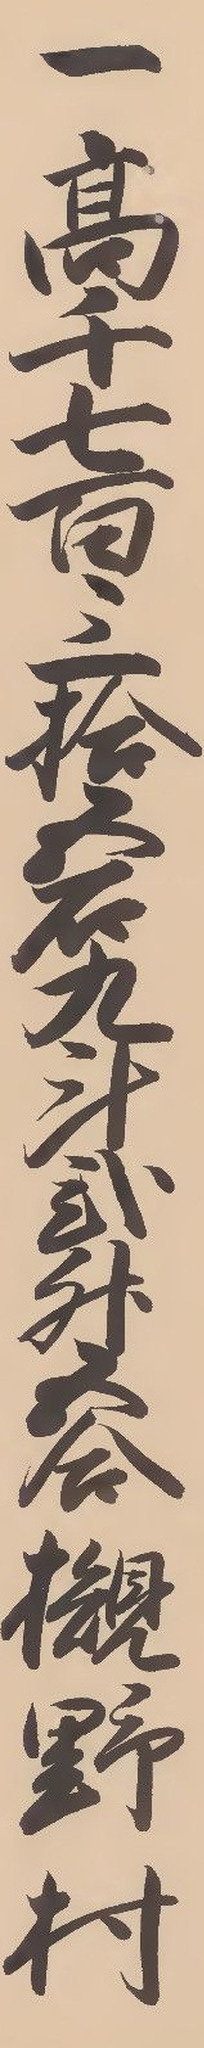一高千七百三拾五石九斗弐升五合槻野村
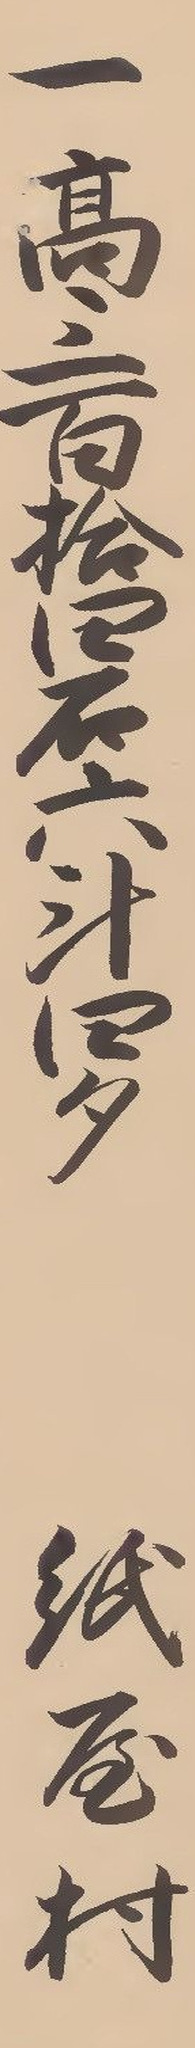一高三百拾四石六斗四勺紙屋村
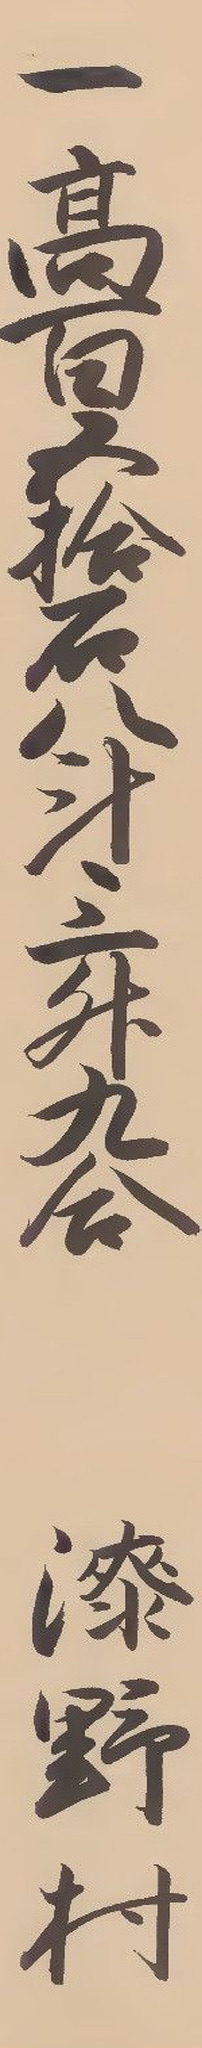一高百五拾石八斗三升九合漆野村
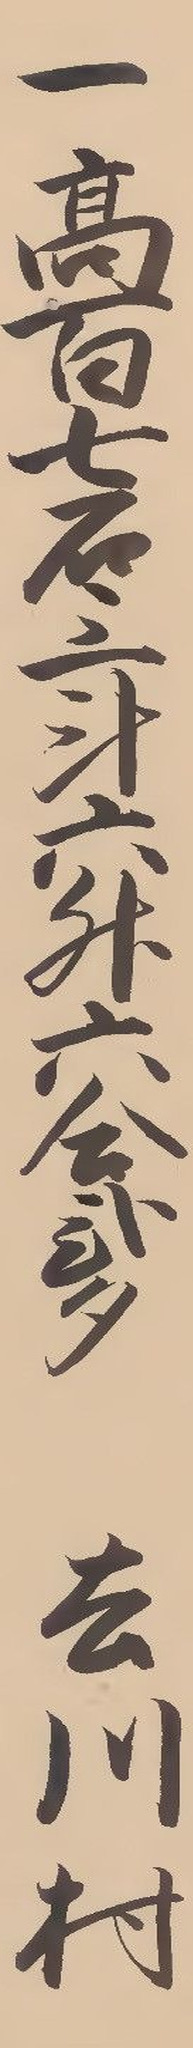一高百七石三斗六升六合弐勺去川村
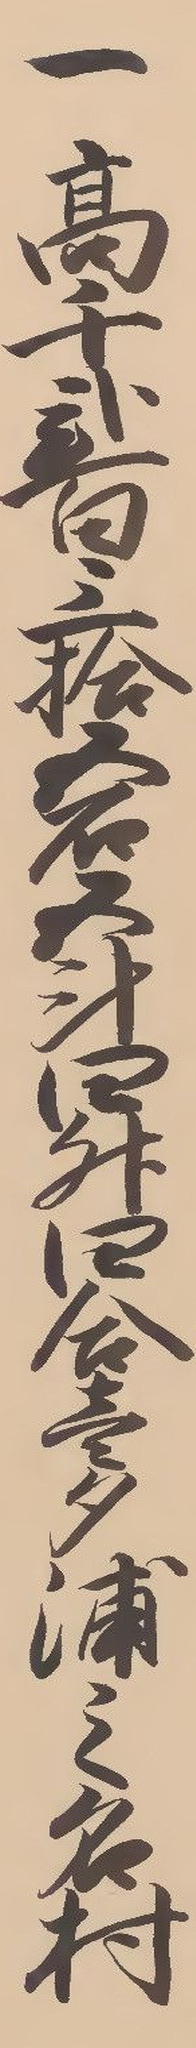一高千弐百三拾五石五斗四升四合壱勺浦之名村

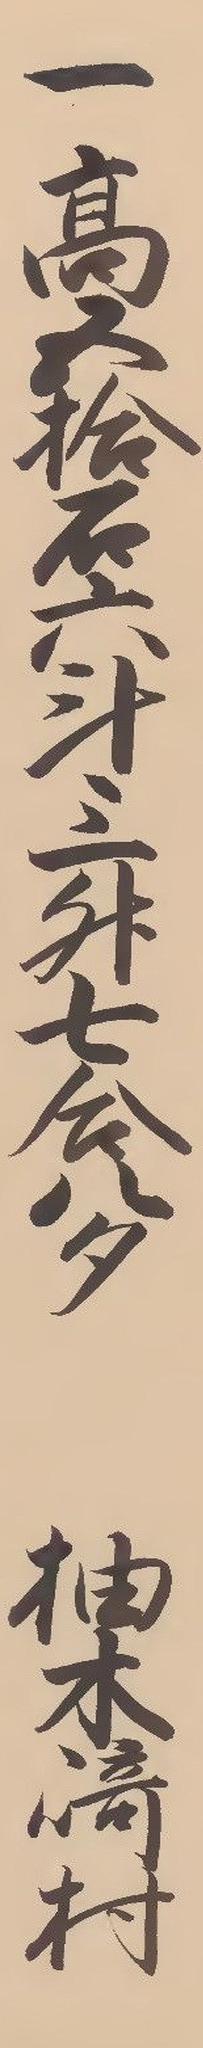一高五拾石六斗三升七合八勺柚木崎村
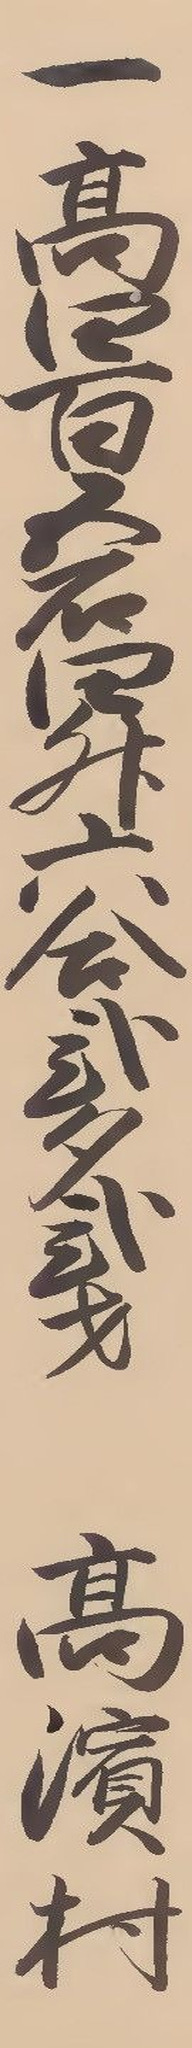一高四百五石四升六合弐勺弐才高浜村
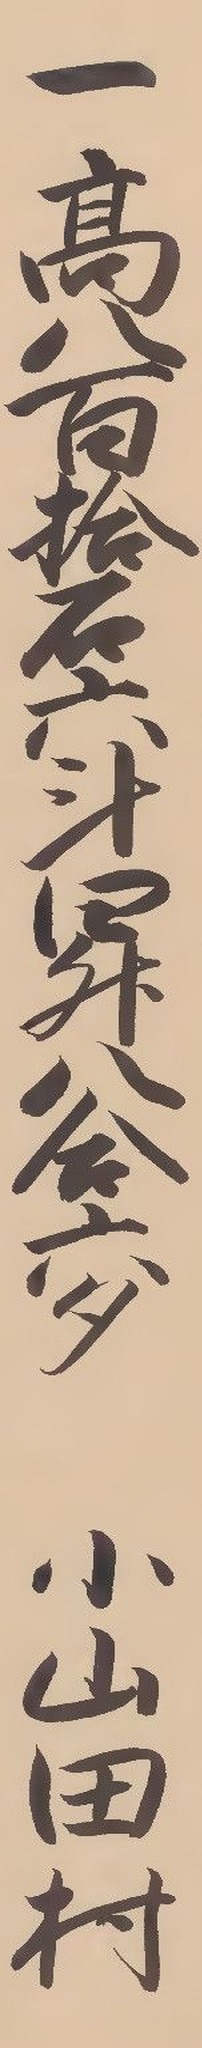一高八百拾石六斗四升八合六勺小山田村
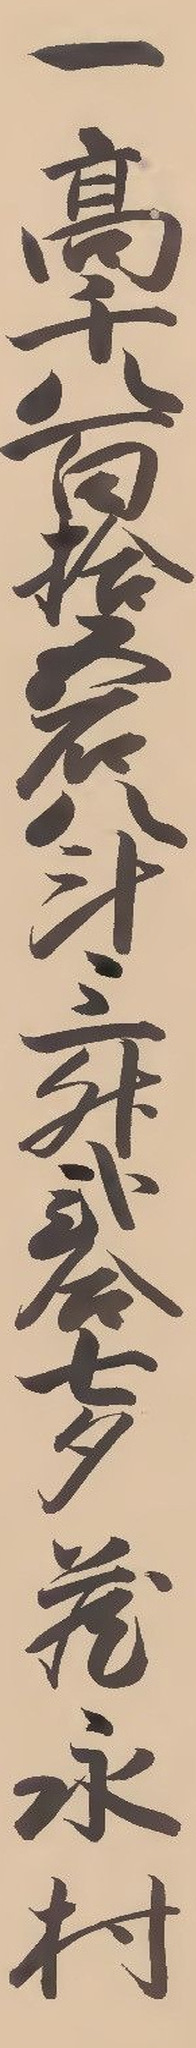一高千八百拾五石八斗三升弐合七勺蔵永村
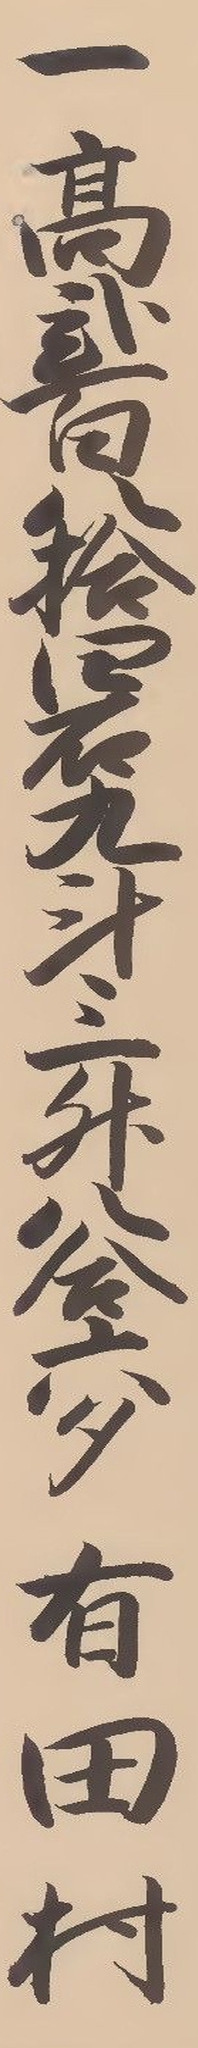一高弐百八拾四石九斗三升八合六勺有田村
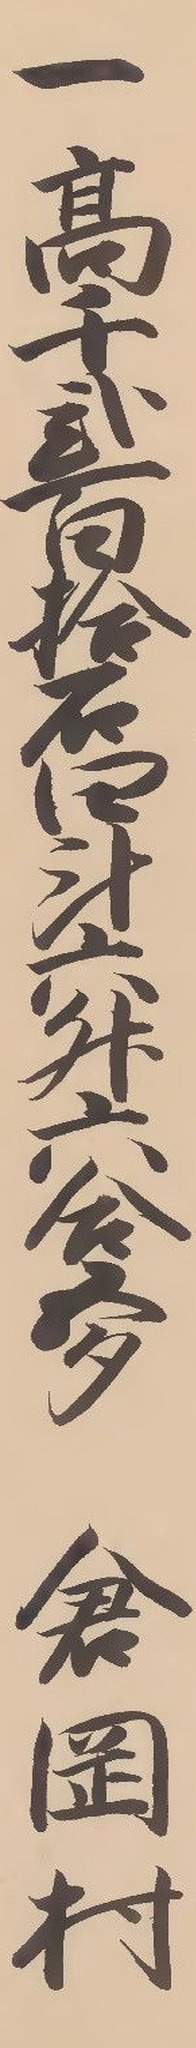一高千弐百拾石四斗六升六合五勺倉岡村
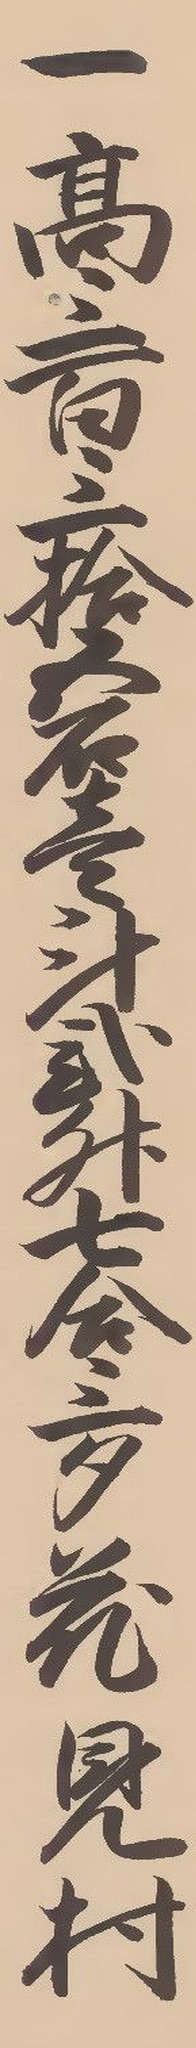一高三百三拾五石壱斗弐升七合三勺花見村
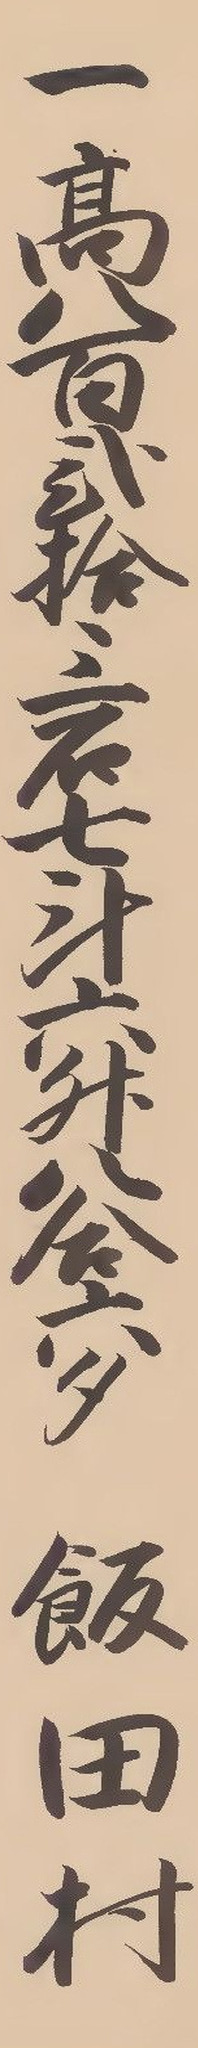一高八百弐拾三石七斗六升八合六勺飯田村
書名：日向国郷帳
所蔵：国立公文書館 National Archives of Japan
